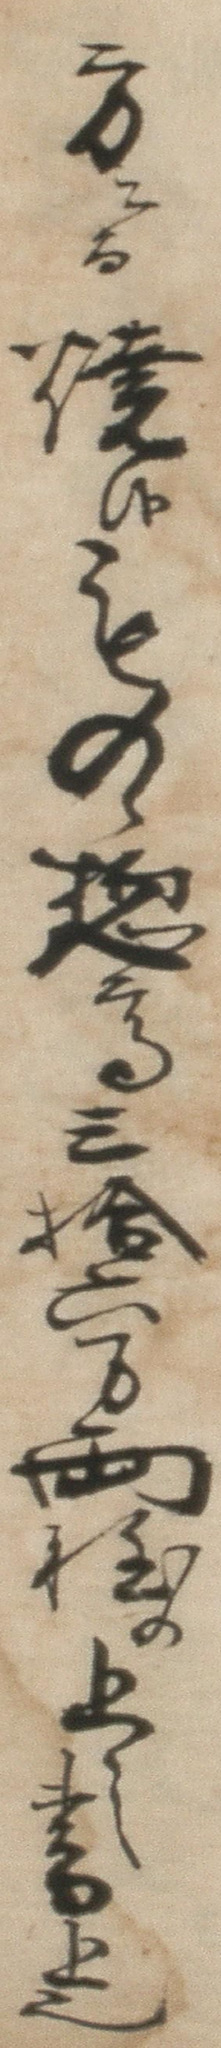方二而焼候ものゝ惣高三拾六万両程の上之書上也
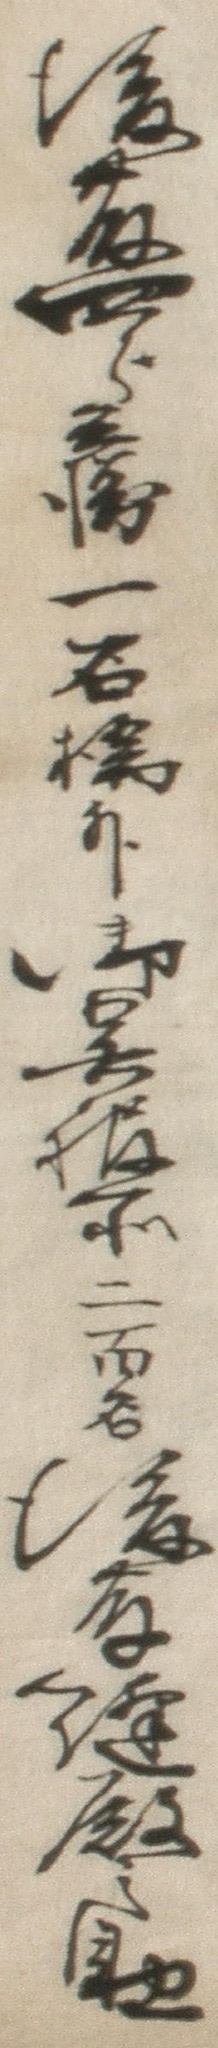後藤四郎兵衛一石橋外御呉服所二百石後藤縫殿之助
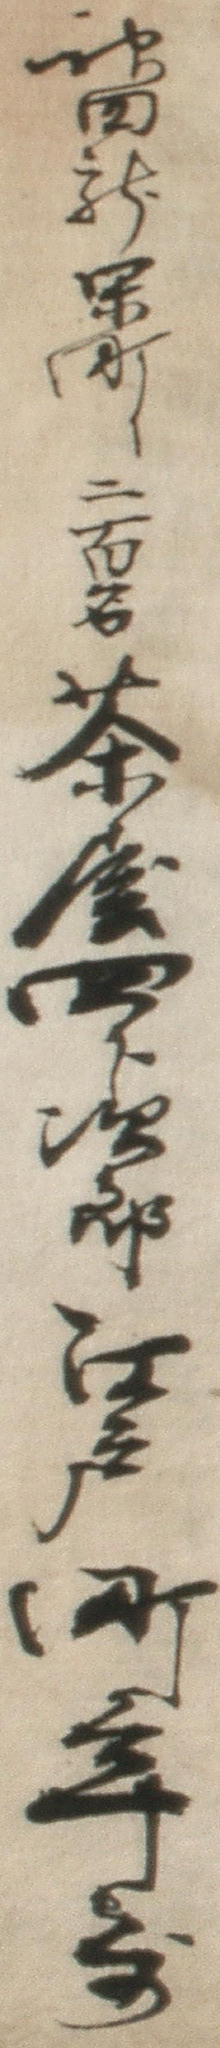神田龍閑町二百石茶屋四郎次郎江戸町年寄
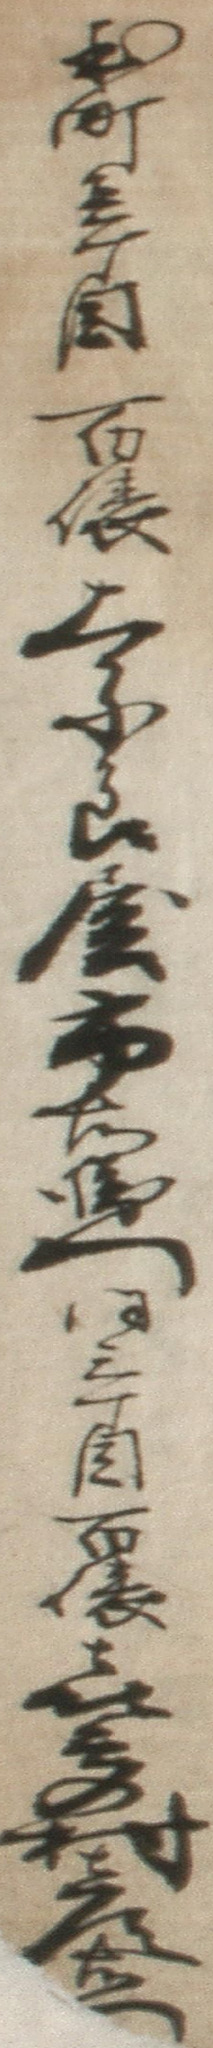本町壱丁目百俵奈良屋市右衛門同三丁目百俵喜多村彦右衛門

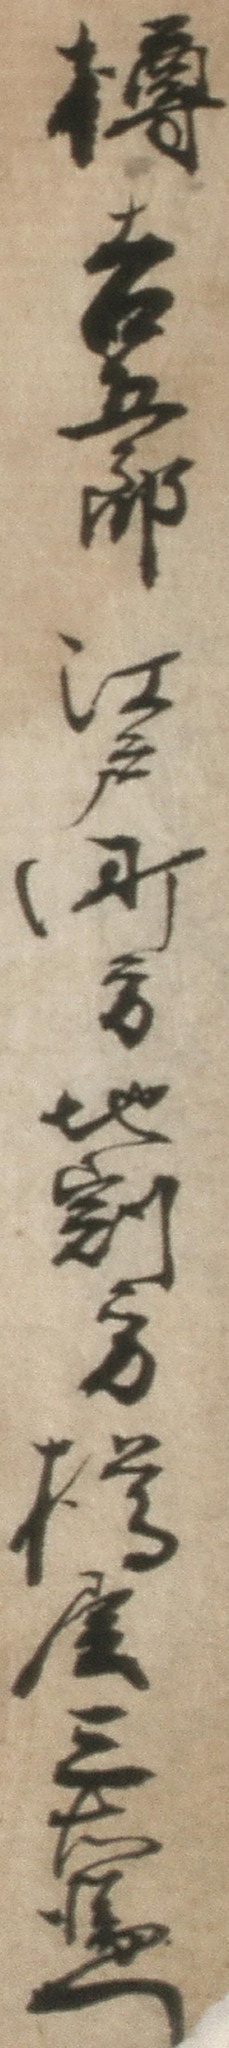樽吉五郎江戸町方地割方樽屋三右衛門
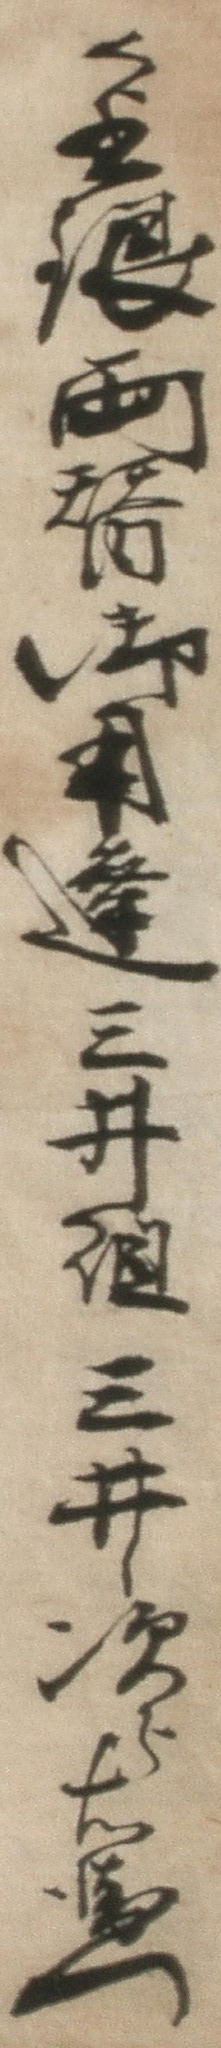金銀両替御用達三井組三井次郎右衛門
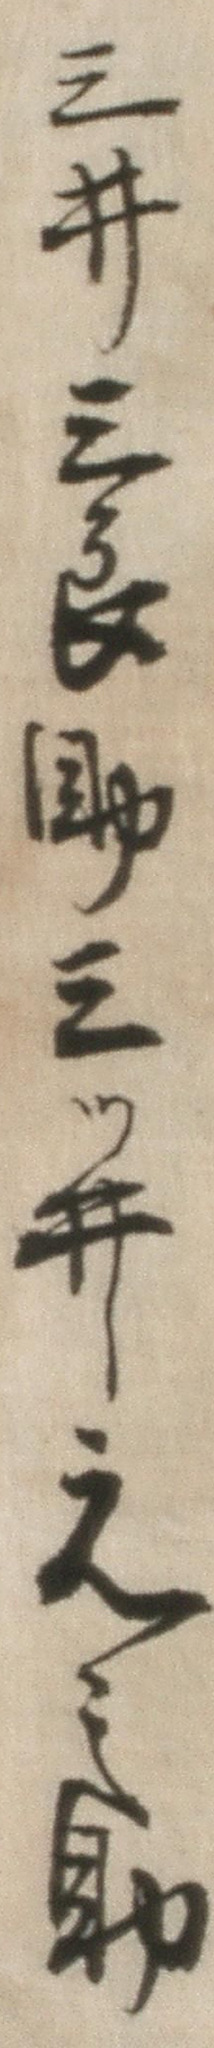三井三良助三ッ井元之助
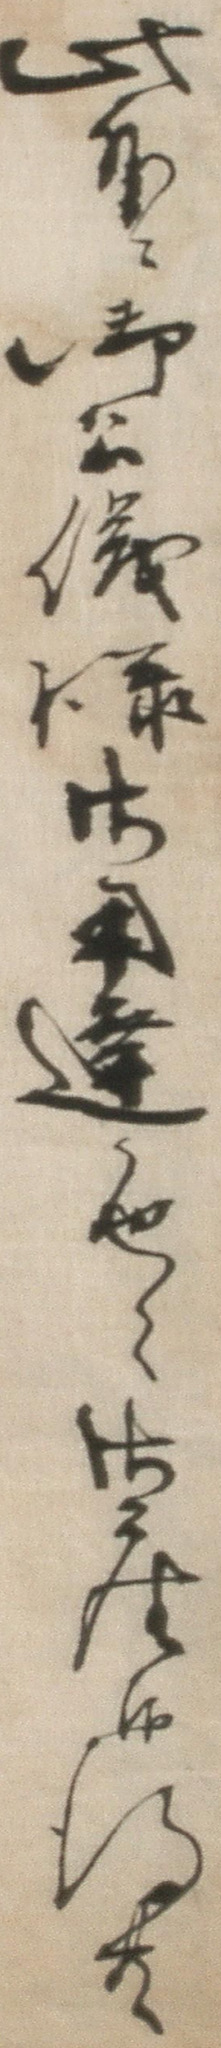此外二御公儀様御用達色々御座候得共
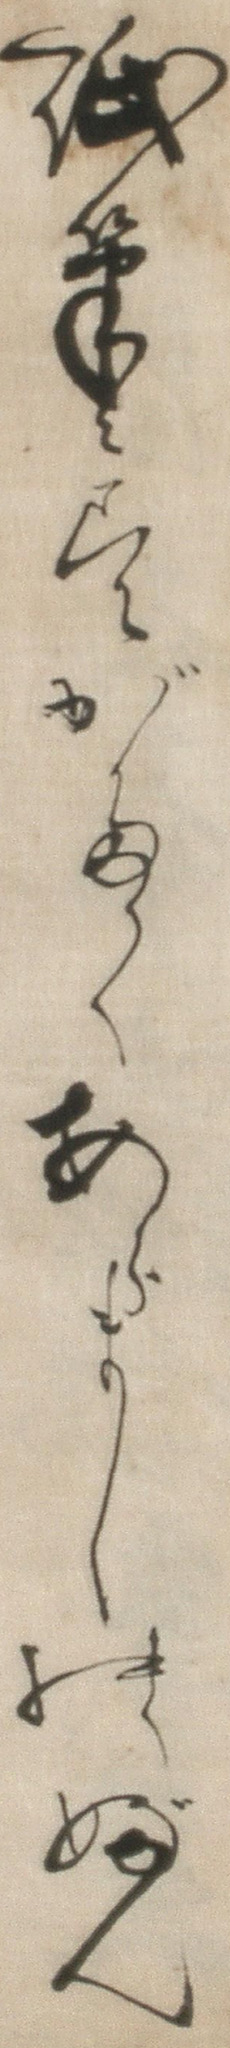紙筆二尽がたくあらましのぶん
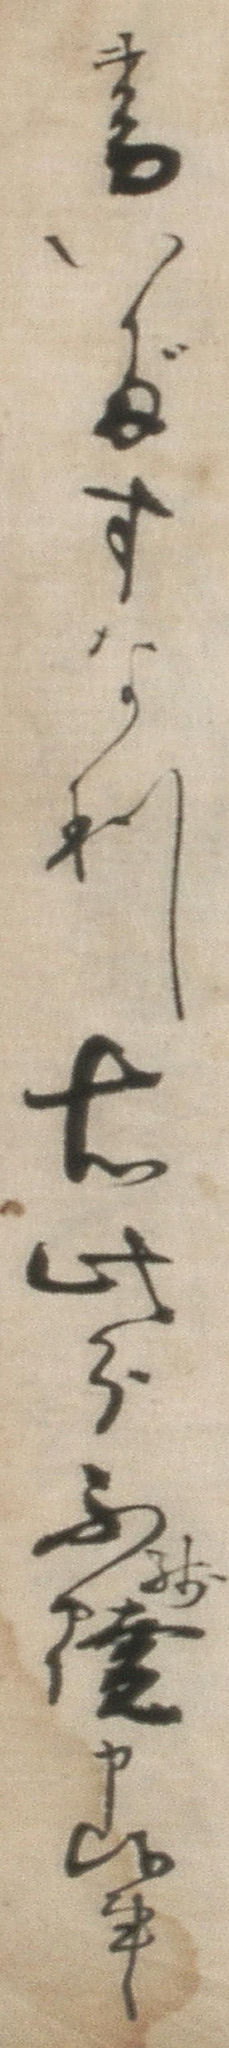書いだすなり右此分不残焼申候事
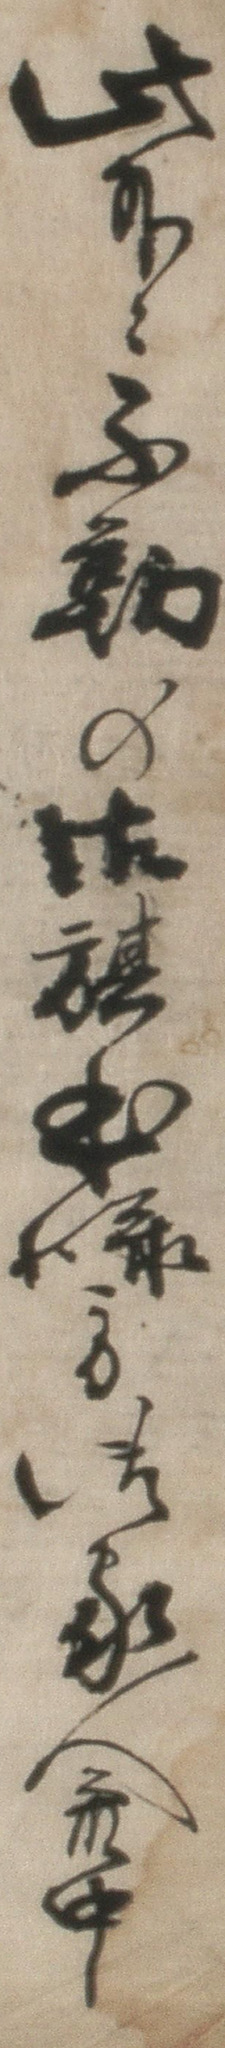此外二不勤の御旗本様方御家人衆中
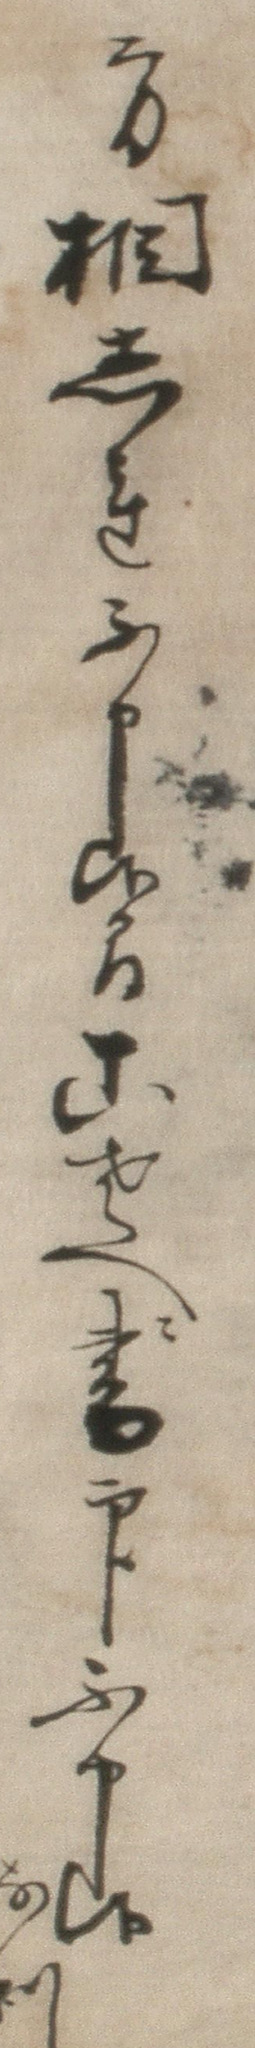方相しれ不申候間こさへ二書印不申候なり
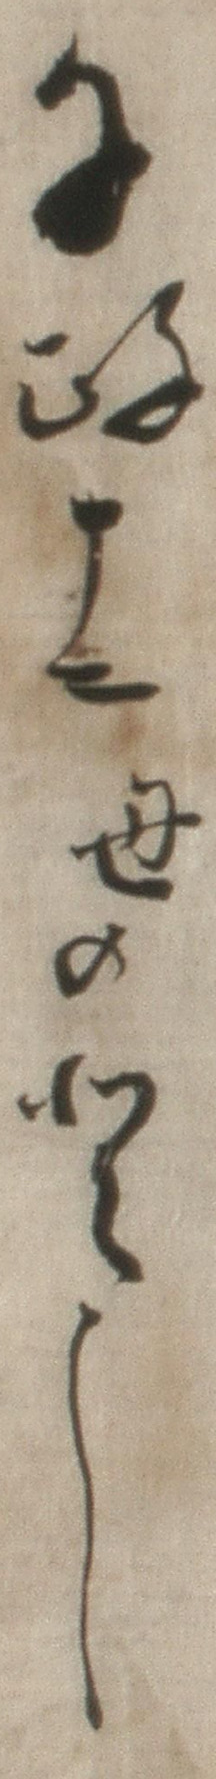文政十二丑のとし
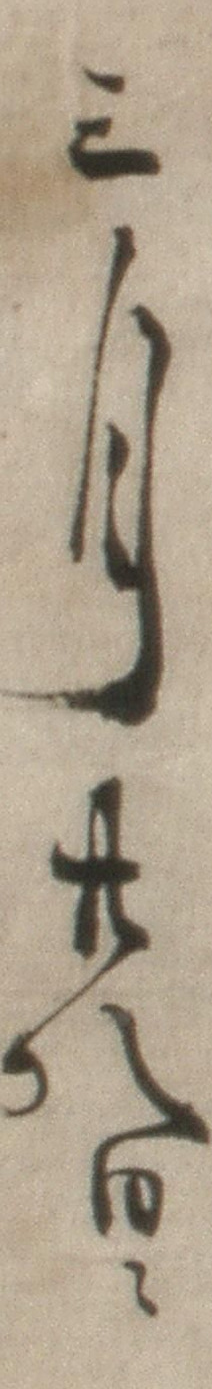三月廿八日二
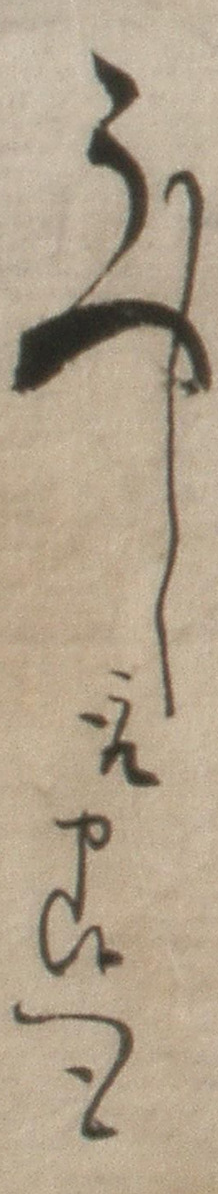うつし取申候以上
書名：文政十二丑としの類焼場所附
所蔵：東京大学地震研究所図書室 Earthquake Research Institute Library, The University of Tokyo, JAPAN
